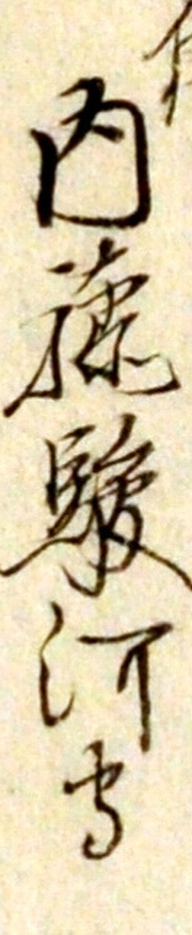内藤駿河守
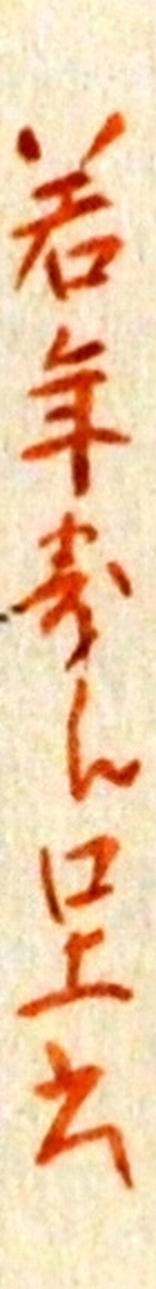若年寄え口上書
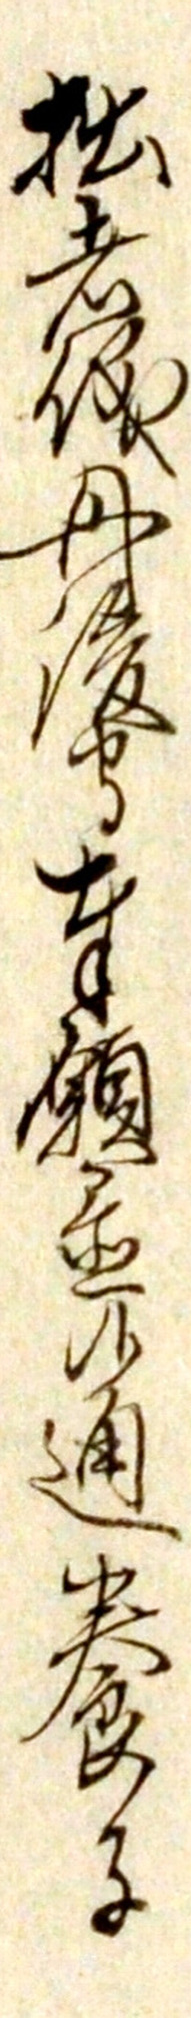拙者儀丹後守奉願置候通養子
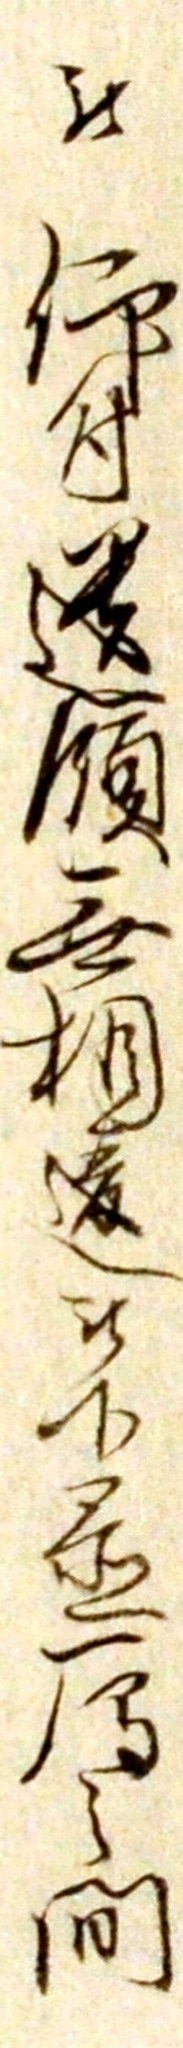被仰付遺領無相違被下置雁之間
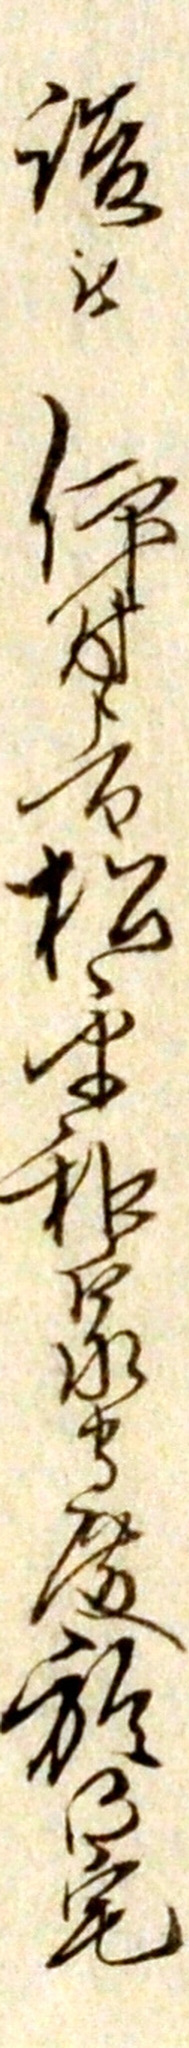詰被仰付旨松平和泉守殿於御宅
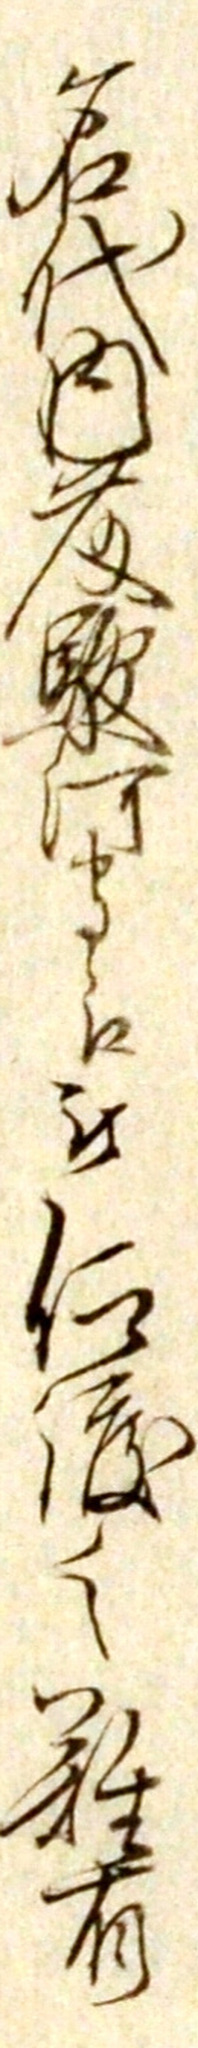名代内藤駿河守え被仰渡之難有
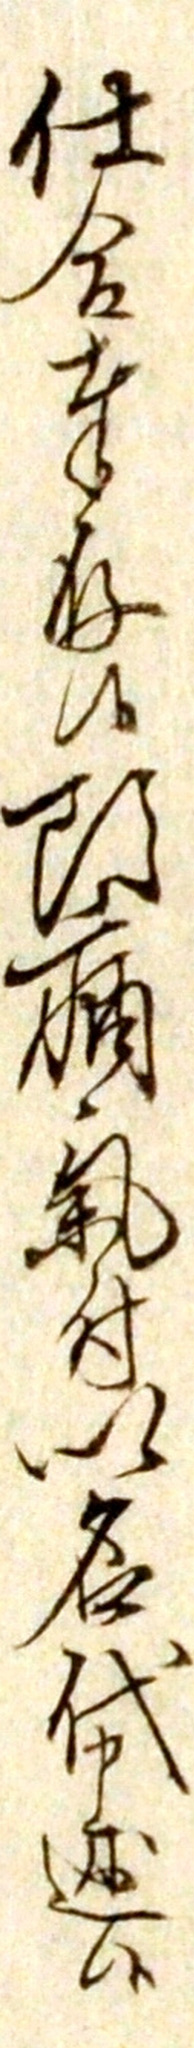仕合奉存候頭痛気付以名代申述候
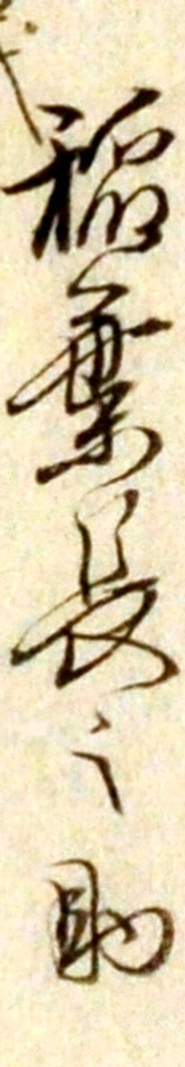稲葉長之助
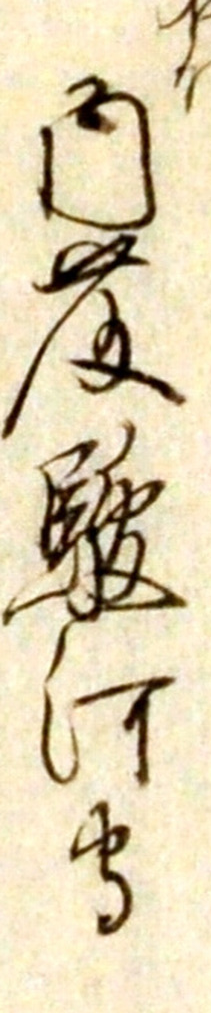内藤駿河守

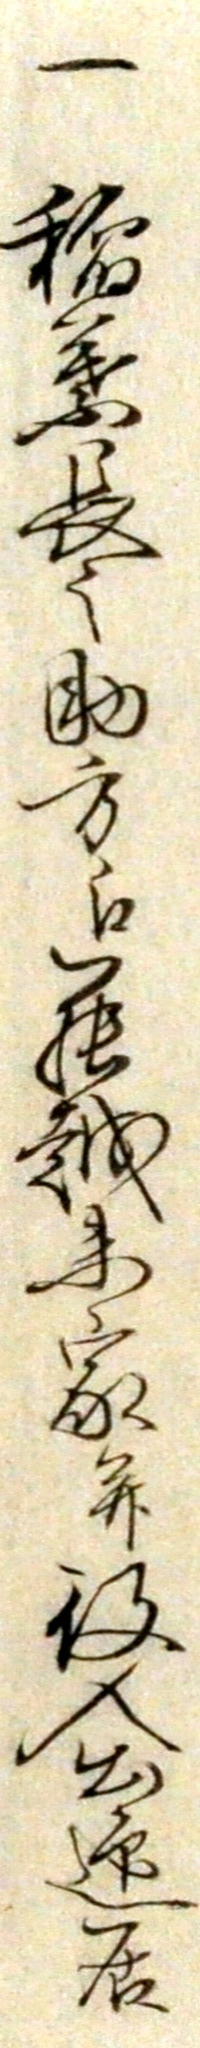一稲葉長之助方え罷越末家并役人出迎居
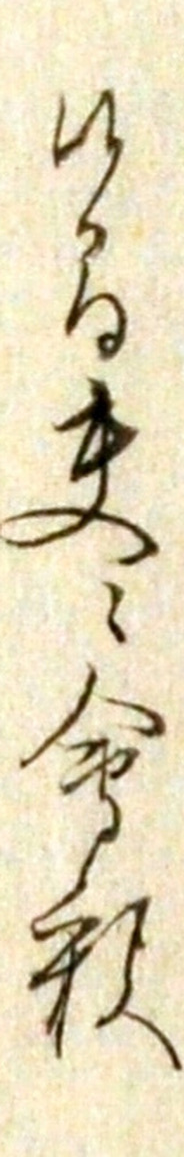候間夫々会釈
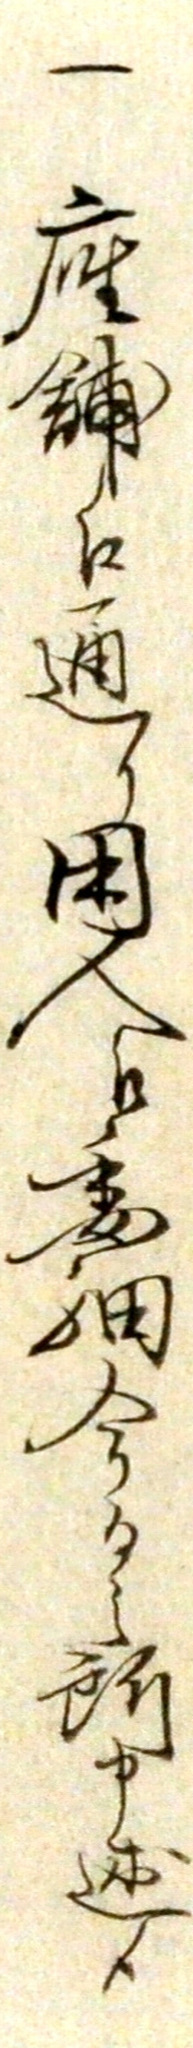一座舗え通り用人え委細今日之所申述候
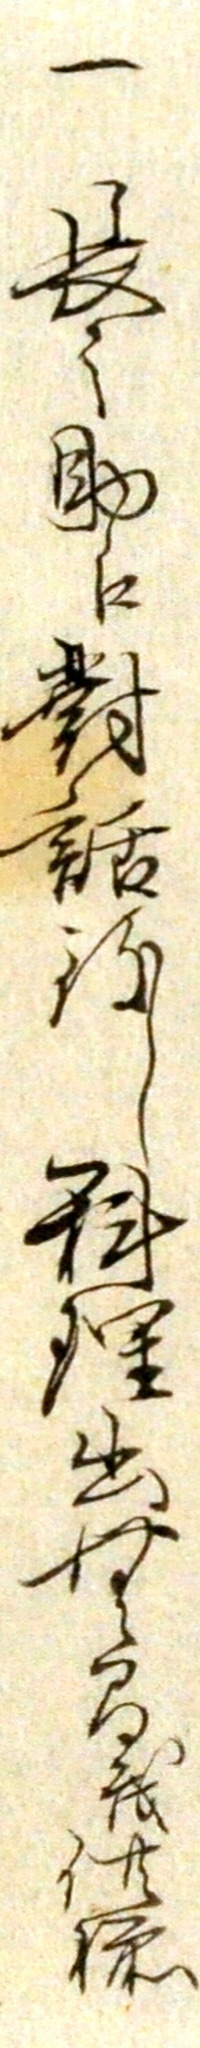一長之助え対話致し料理出無間も供揃
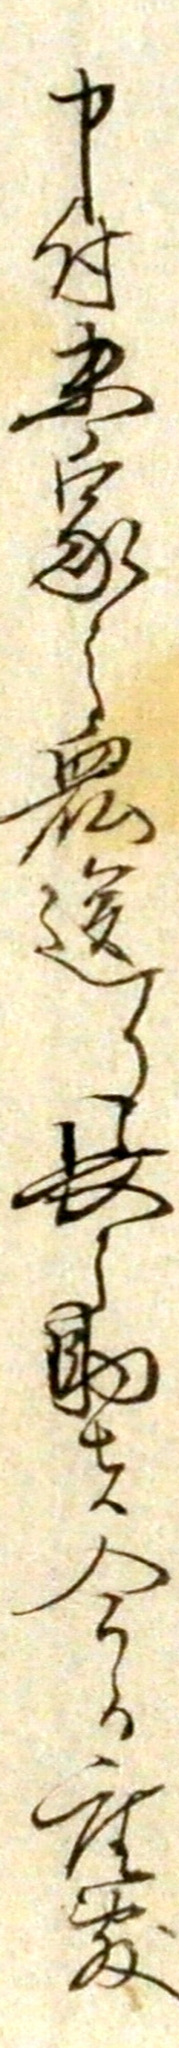申付末家之衆送り長之助は今日座敷
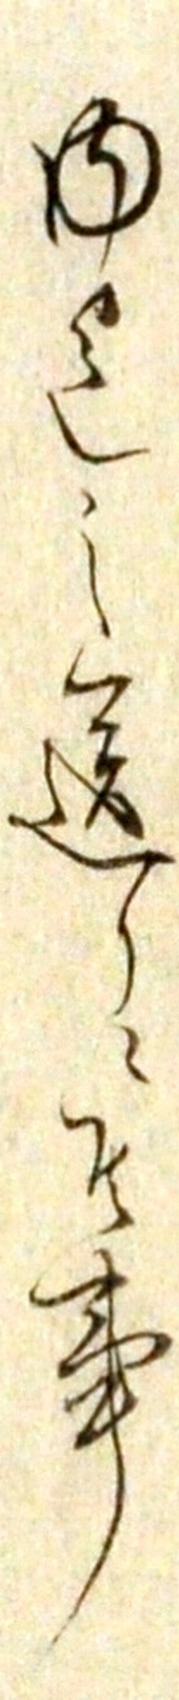内迄之送りニ候事
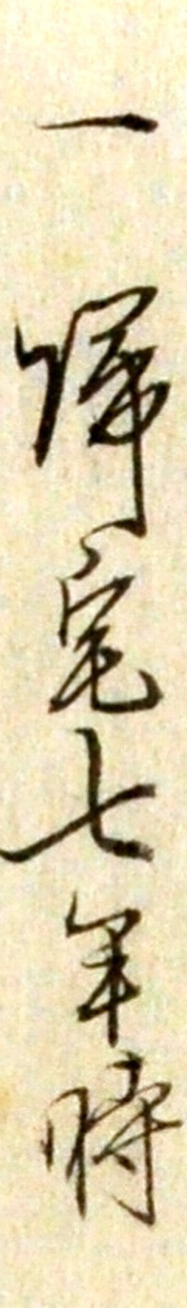一帰宅七半時
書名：諸名代相勤候節ノ留書外
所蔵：伊那市立高遠町図書館・合同会社AMANE
